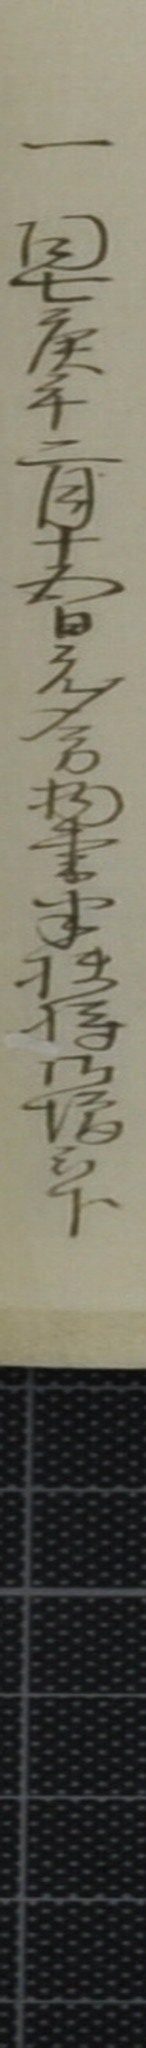一同七庚午二月十五日元〆方物書半扶持御増被下
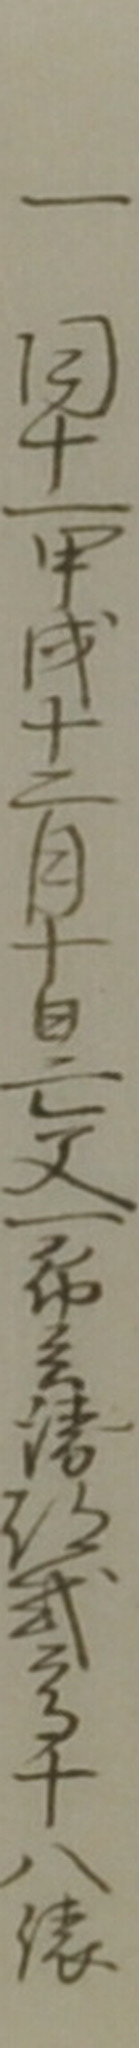一同十一甲戌十二月十日亡父一郎兵衛跡式十八俵
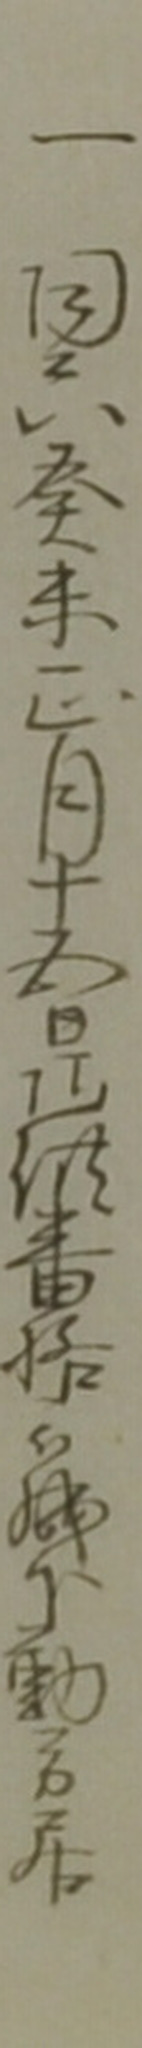一同六癸未正月十五日御供番格被成下勤方居
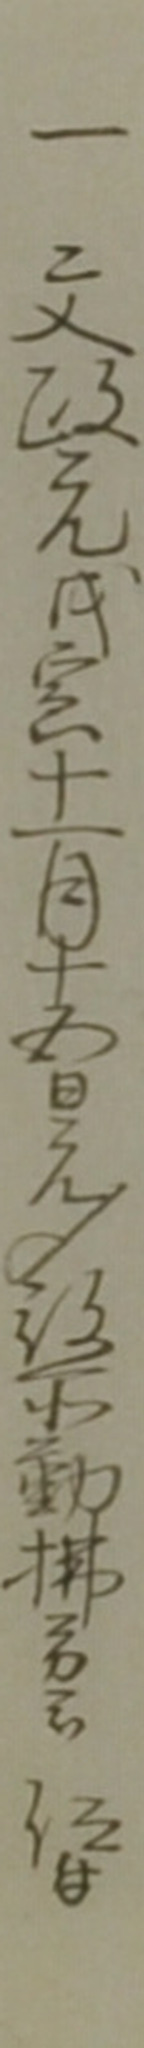一文政元戌寅十一月十五日元〆役所勤払方被仰付
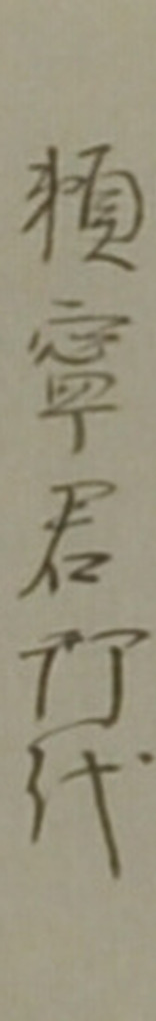頼寧君御代
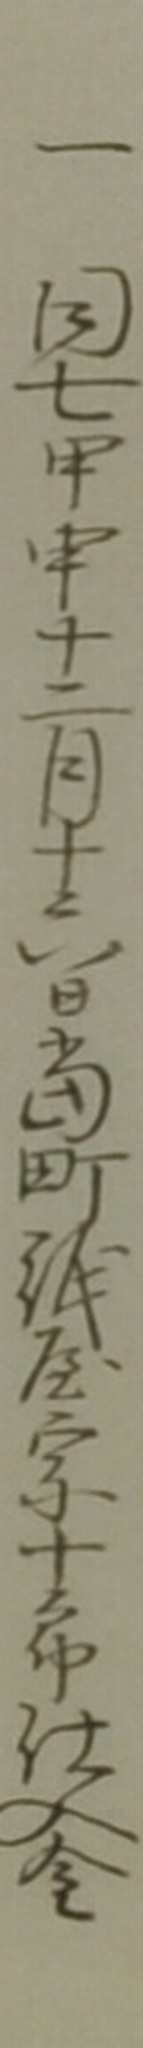一同七甲申十二月十六日当町紙屋宗十郎仕入金
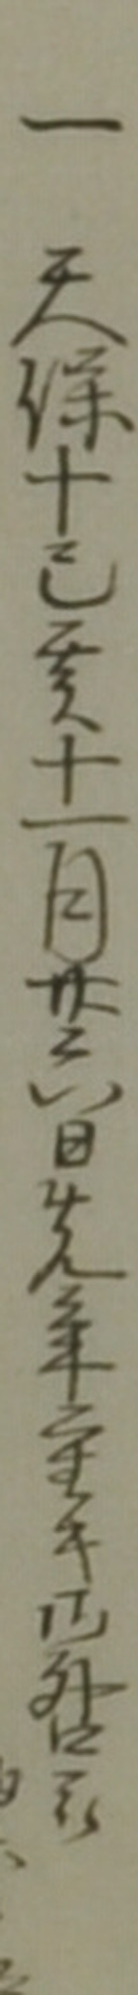一天保十己亥十一月廿六日先年重キ御咎被

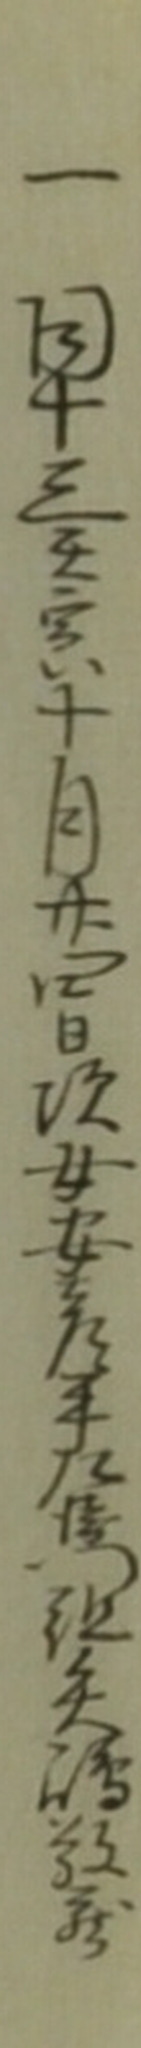一同十三壬寅十月廿四日次女安彦平左衛門組矢嶋敬蔵
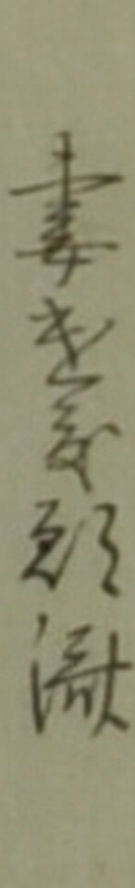妻遣度願済

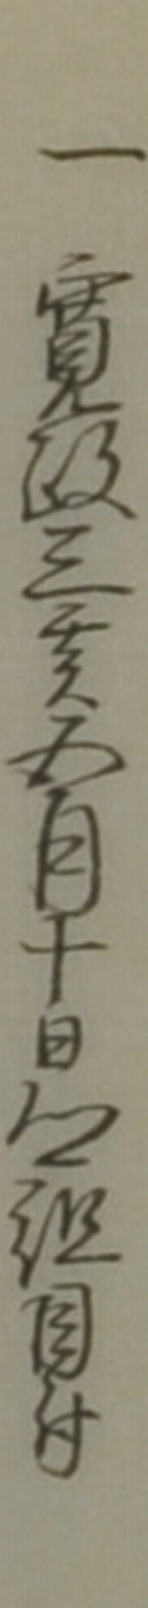一寛政三亥五月十日郷組目付
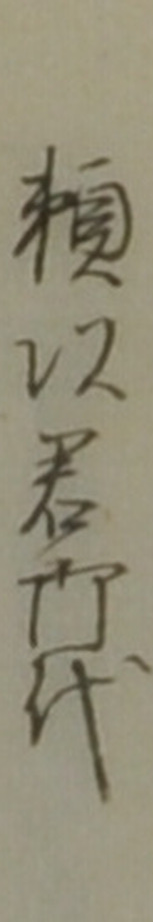頼以君御代
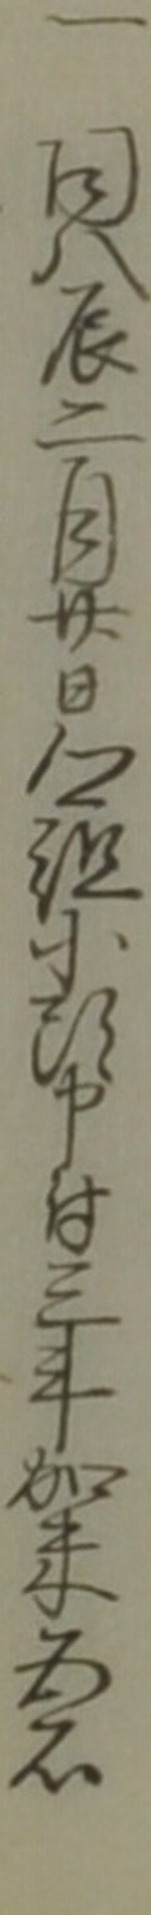一同八辰二月廿日郷組小頭申付三斗加米五石
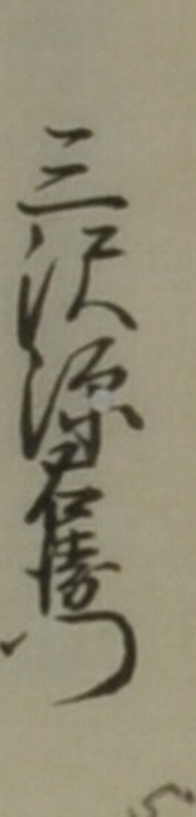三沢源右衛門
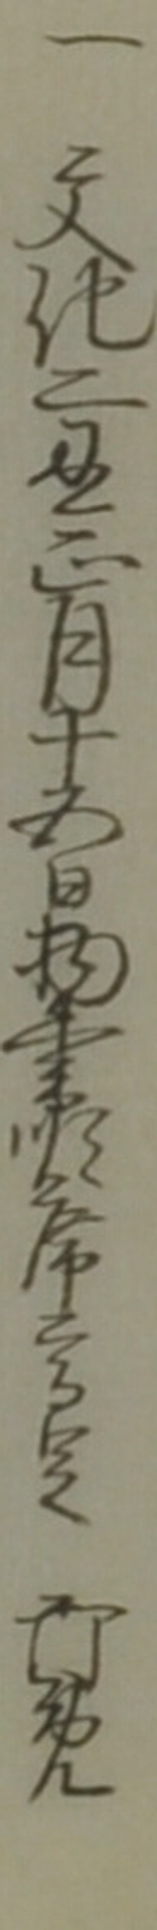一文化二丑正月十五日物書順席高足御免
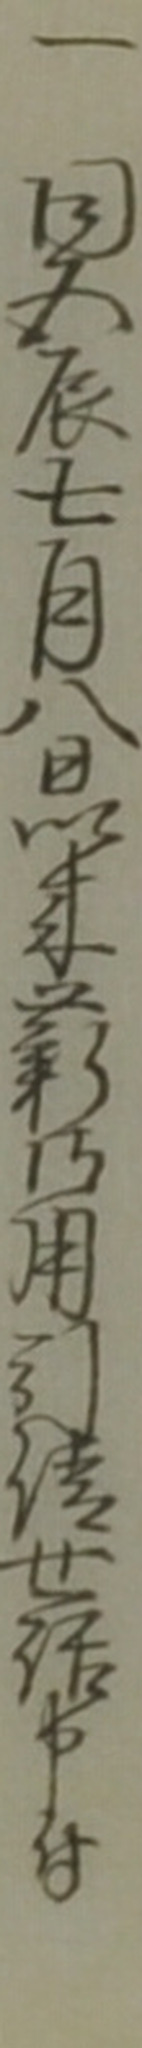一同五辰七月八日以来薪御用引請世話申付
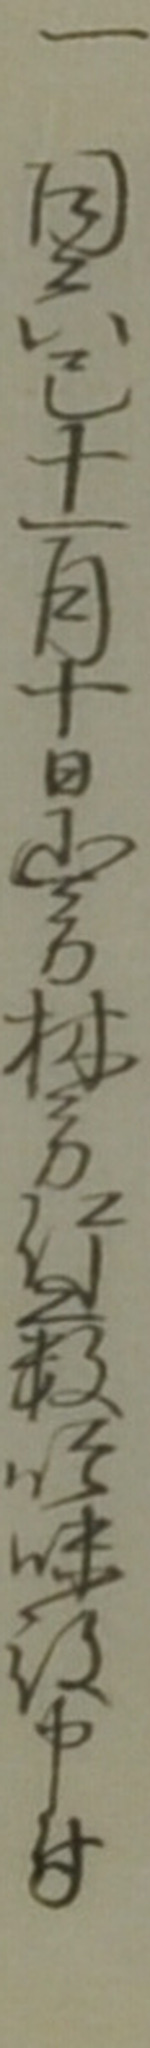一同六巳十一月十日山方林方竹薮吟味役申付
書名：無足諸士勤仕録（八）
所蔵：伊那市立高遠町図書館・合同会社AMANE
